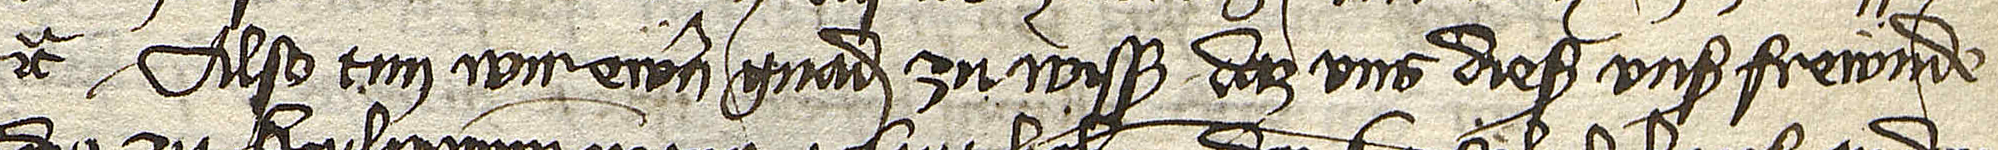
ec* / Alſo tun wir eẅ*n gnad* ʒu wiſſ* / daʒ vns dieſ* vnſ* freẅnde
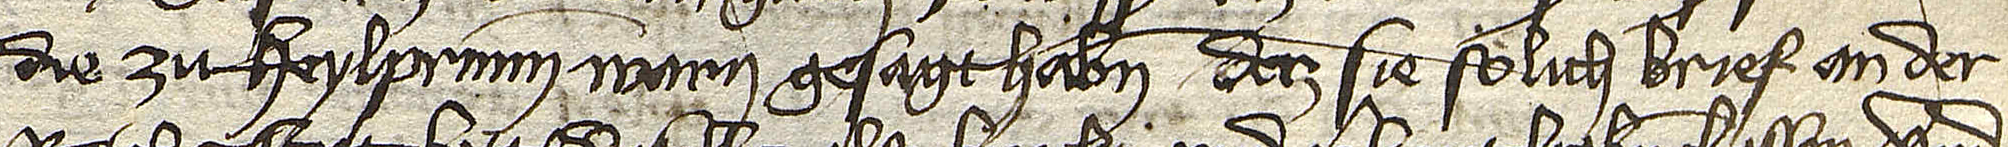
die ʒu heylprunn* warn geſagt habn* / daʒ ſie ſölich brief an der
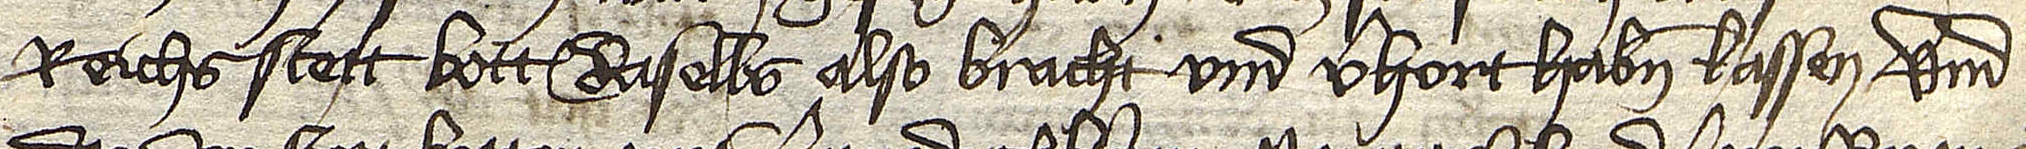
Reichs ſtett bott daſelbs alſo bracht vnd v*hort habn* laſſen / Vnd
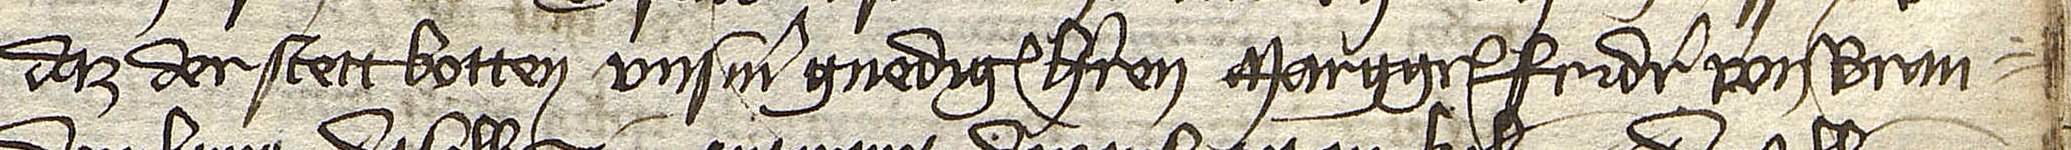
daʒ der ſtett botten vnſm* gnedig* h*ren Marggr* fridr* von Bran =
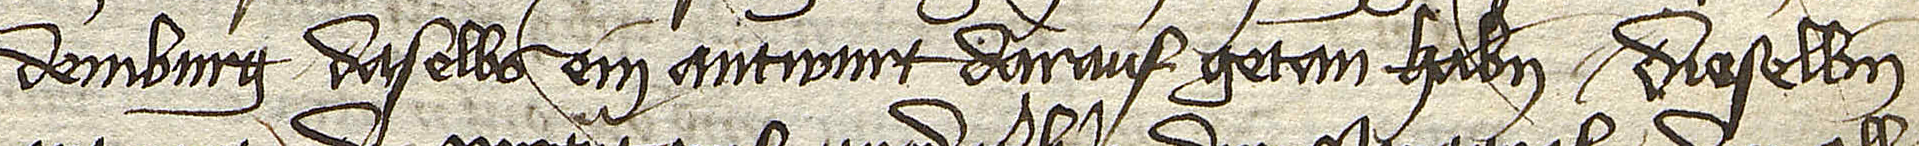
demburg / Daſelbs ein antwurt darauf getan habn* / Dieſelbn*
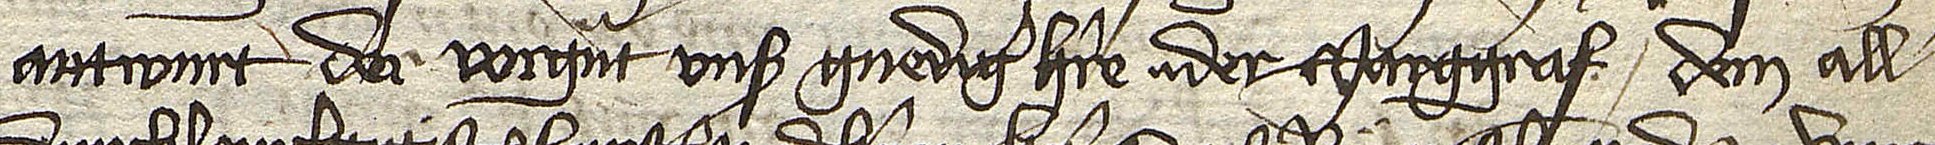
antwurt der vorgnt* vnſ* gnedig* h*re ~ der Marggraf / Dem all*
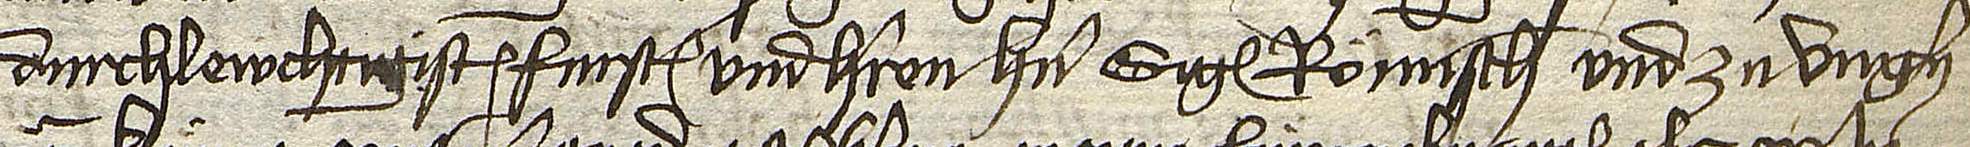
durchlewchtigiſt* furſt* vnd h*ren hn* Sig* Römiſch* vnd ʒu Vng*n
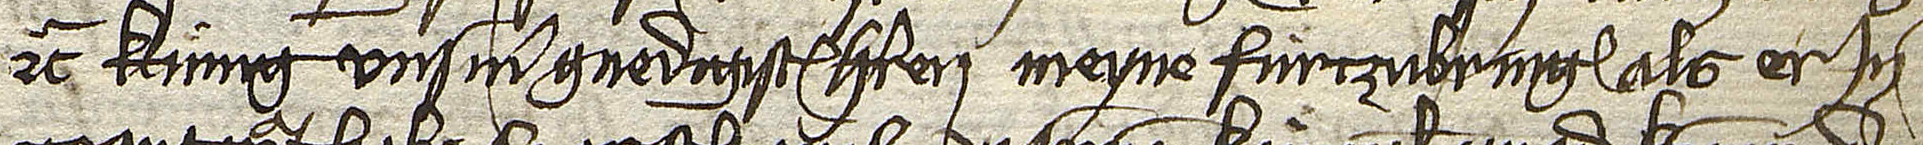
ec* künig vnſm* gnedigiſt* h*ren meyne fürcʒubring* als er In
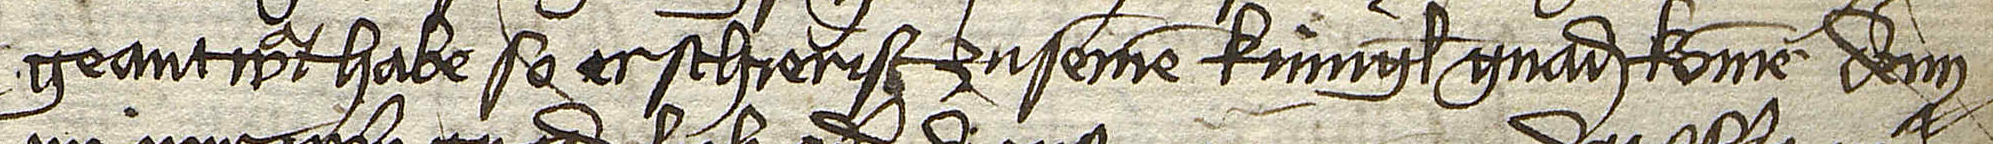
genantw*t habe ſo er ſchieriſt ʒu ſeine* künigl* gnad* kome* Denn
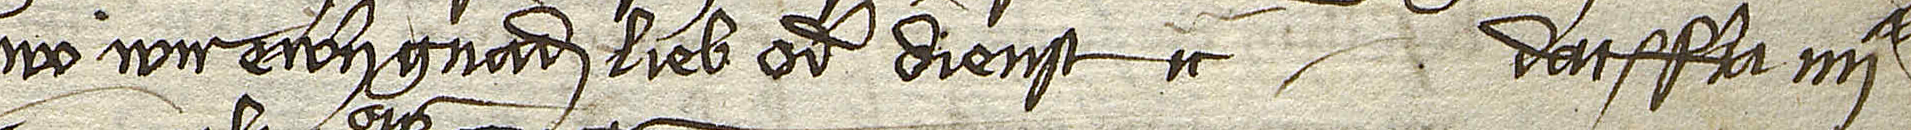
wo wir ew*n gnad* lieb od* dienst ec* / dat* fia* iiii*
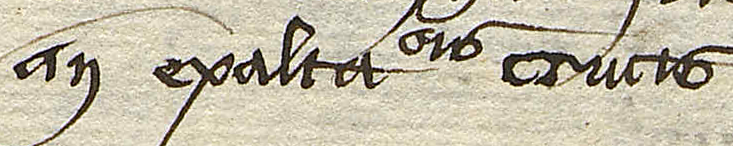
an* exalta* crucis*
